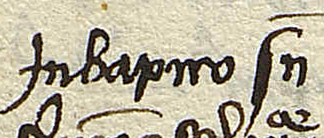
In bapiro ſ*n
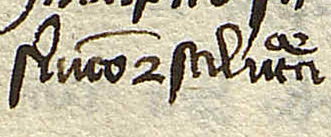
ſ*uico* @ ſaluta*
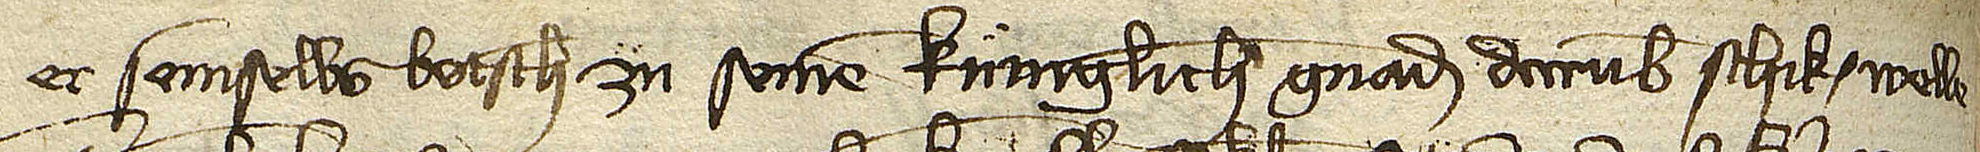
er ſeinſelbs* botſch* ʒu ſeine*küniglich* gnad* darub* ſchik* welle
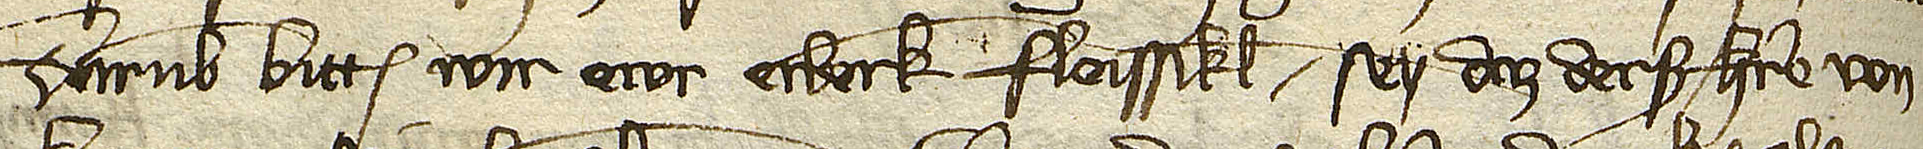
Darub* bitt* wir ewr erberk* fleiſſikl* / ſey daʒ derſ* h*re von
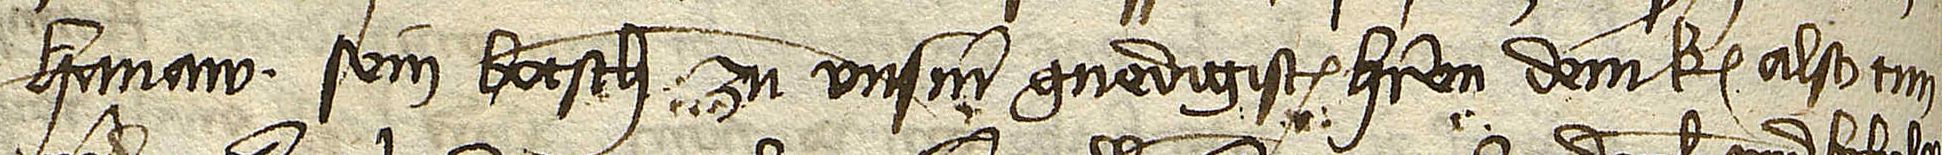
hanaw . ſein botſch* ʒu vnſ*m gnedigiſt* h*ren dem k* alſo tun
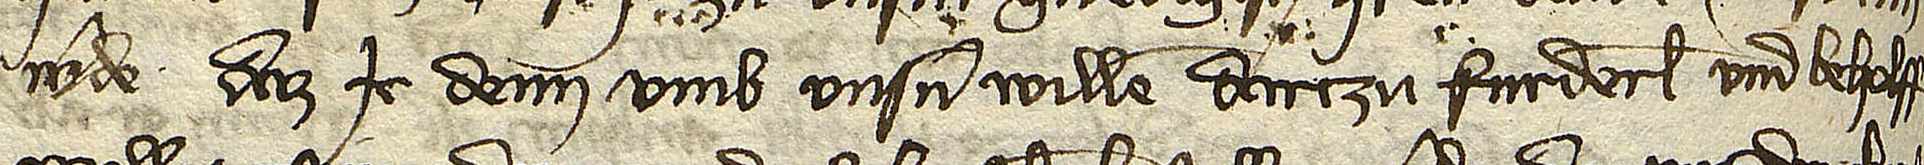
w*de . Daʒ Ir denn vmb vnſ*n wille* darcʒu furderl* vnd beholff*
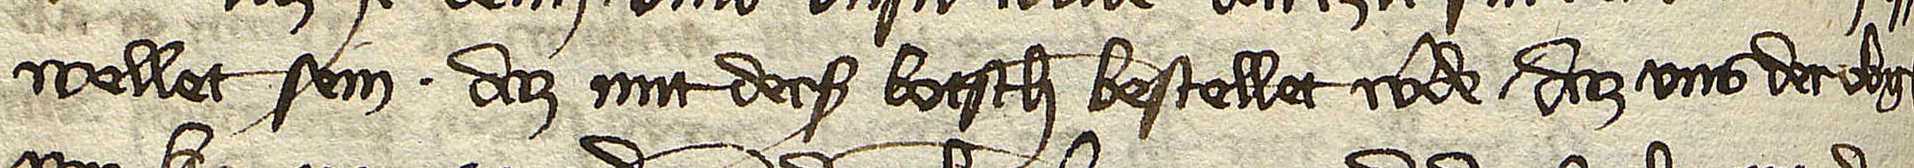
wellet ſein . daʒ mit derſ* botſch* beſtellet w*de / daʒ vns der obg*
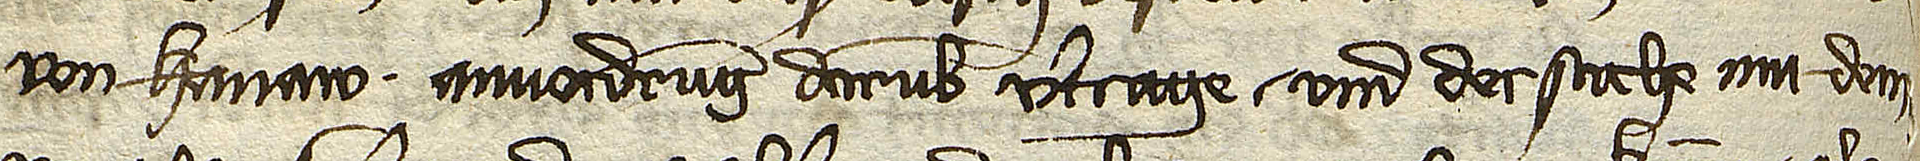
von hanaw . anuordru*g darub* v*trage / vnd der ſache mit dem
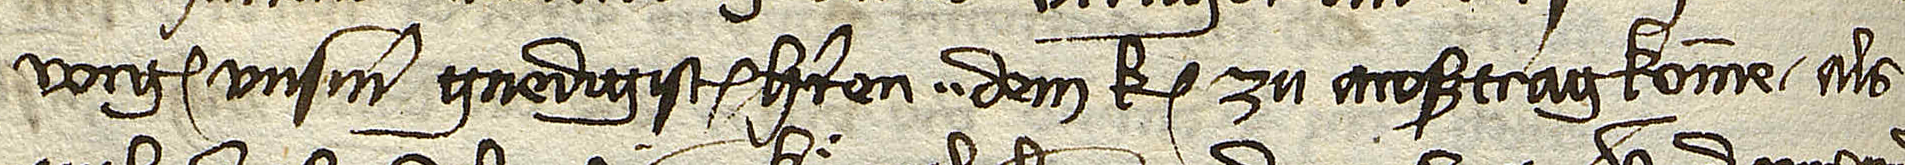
vorg* vnſ*m gnedigiſt* h*ren ~ dem k* ʒu awſʒtrag kome* / als
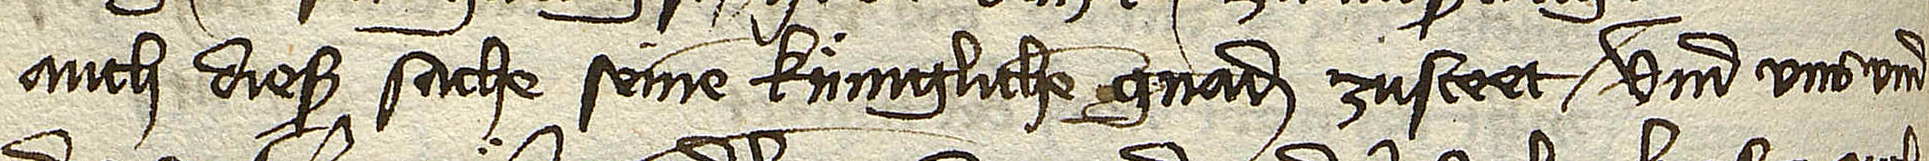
auch dieſ* ſache ſeine* künigliche* gnad* ʒuſteet / Vnd vns vnd
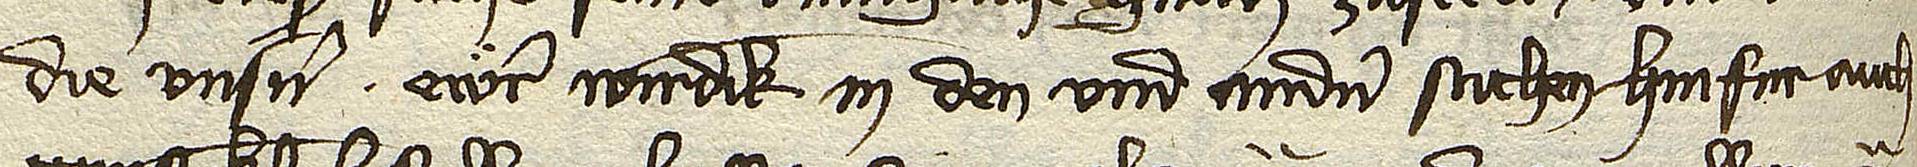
die vnſ*n . eẅr wirdik* in den vnd and*n ſachen hinfur auch
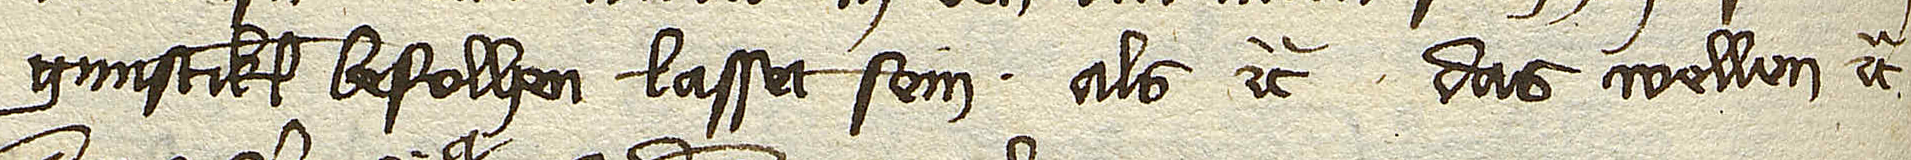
gunſtikl* befolhen laſſet ſein . als ec* das wellen ec*
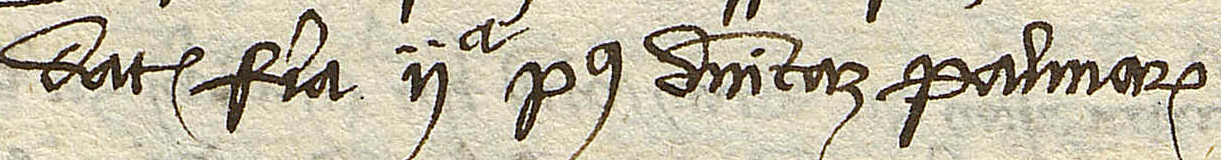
Dat* f*ia ii* p* dnica* Palma*
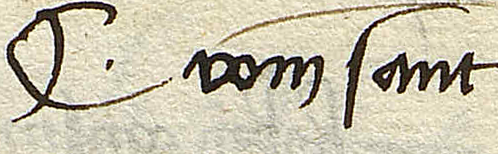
C . vom* ſant
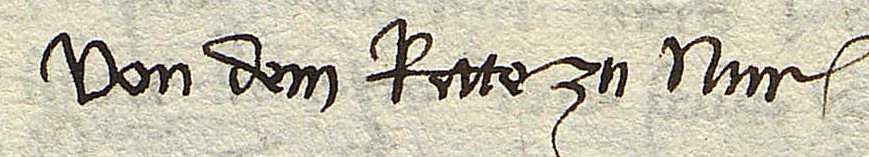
Von dem Rate ʒu Nur*
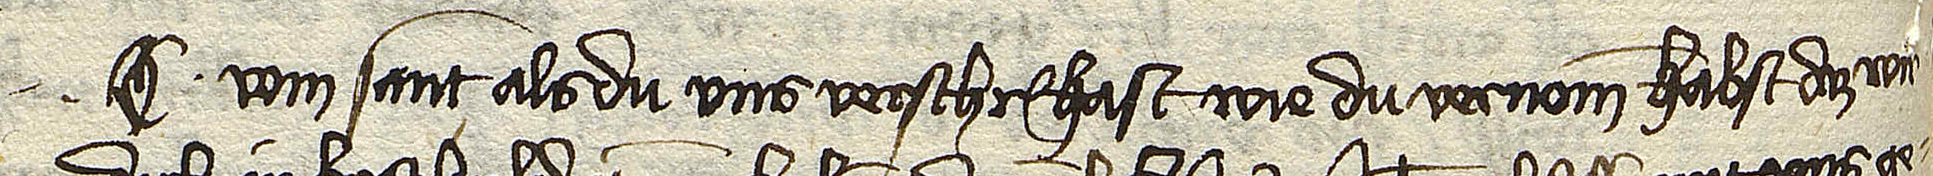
C . vom ſant als du vns verſchr* haſt wie du vernom* habſt daʒ wir
